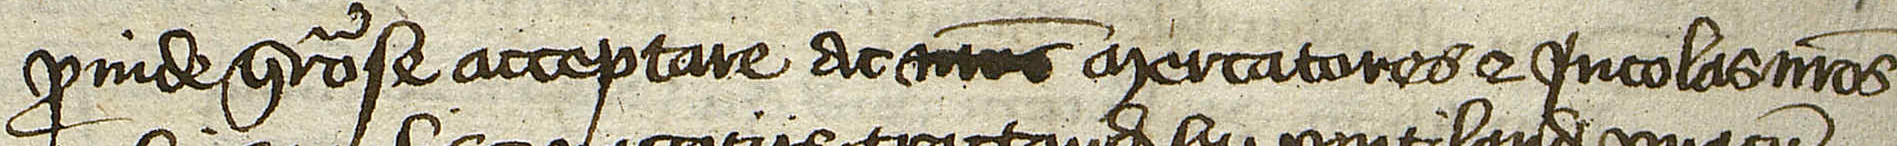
p*inde g*roſe acceptare Ac n*ros Mercatores @ Incolas n*ras
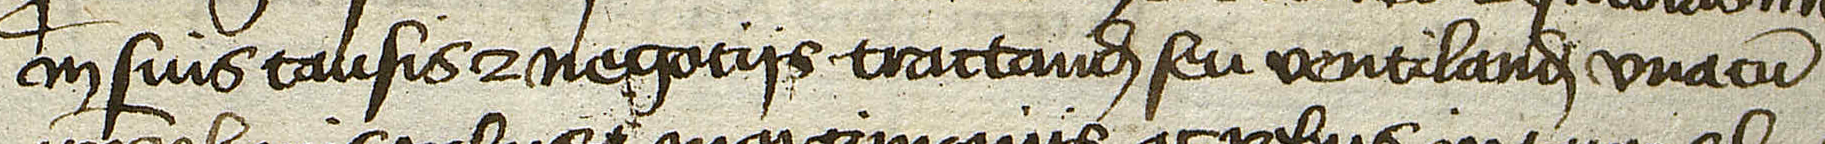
in ſuis cauſis @ negotiis tractand* ſeu ventiland* vnacu*
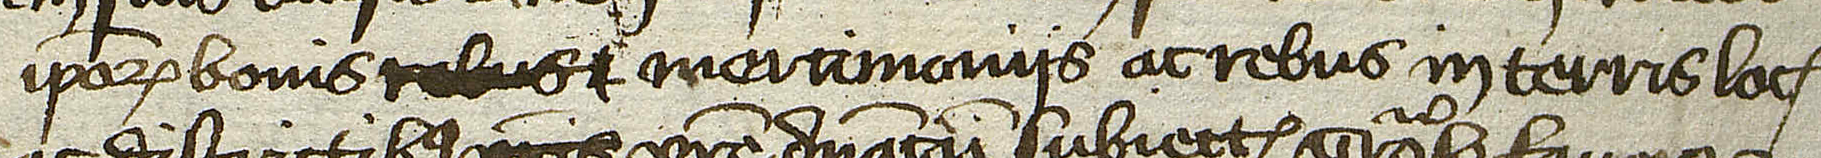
ip*o* bonis rebus mercimoniis ac rebus in terris loc*
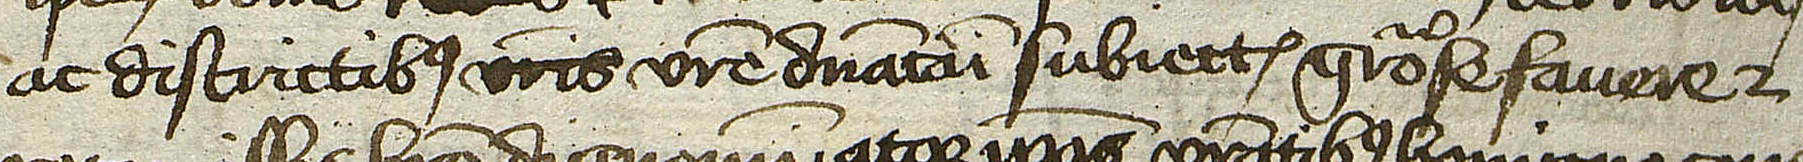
ac diſtrictib* v*ris v*re d*nac*o*i ſubiect* g*roſe fauere @
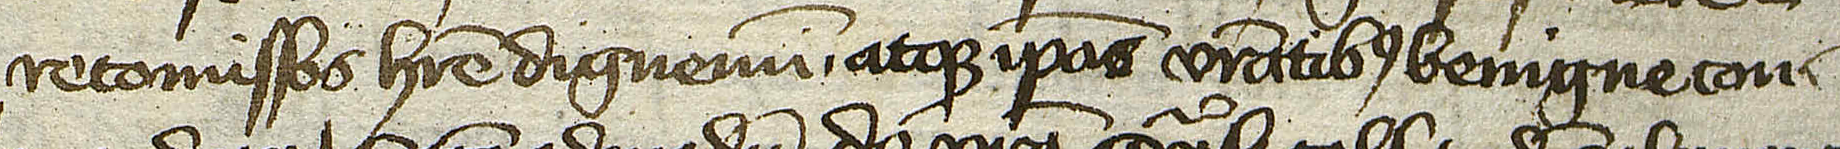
recomiſſos hre* dignemi* / atq* ipo* vratib* benigne con =
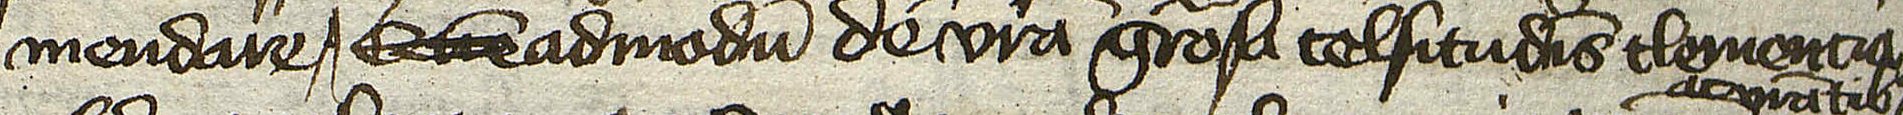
mendare Que* admodu* de v*ra g*roſa celſitud*is clemencia
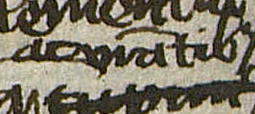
ac v*ratib*
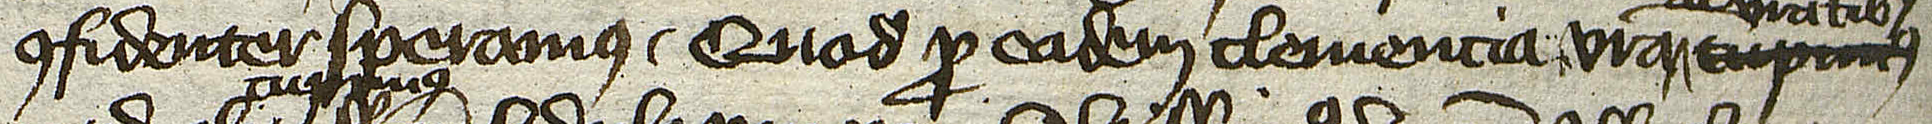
*fidenter ſperam* / Quod p* eadem clemencia v*ra cupim*
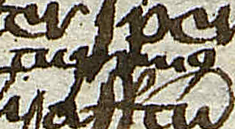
cupim*
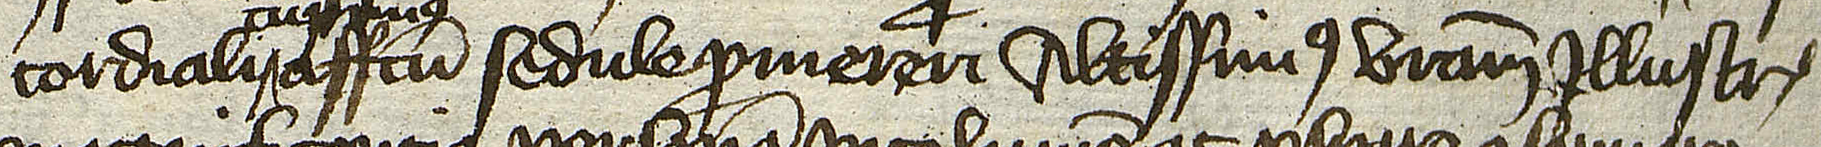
cordiali aff*c*u* ſedule p*mereri Altiſſim* v*ram Illuſtr*
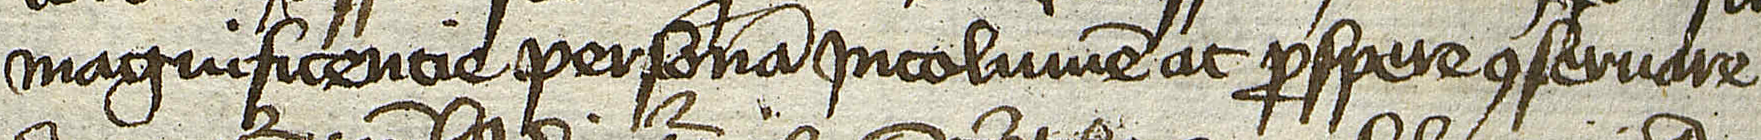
magnificencie perſona* Incolume* ac p*ſpere *ſeruare
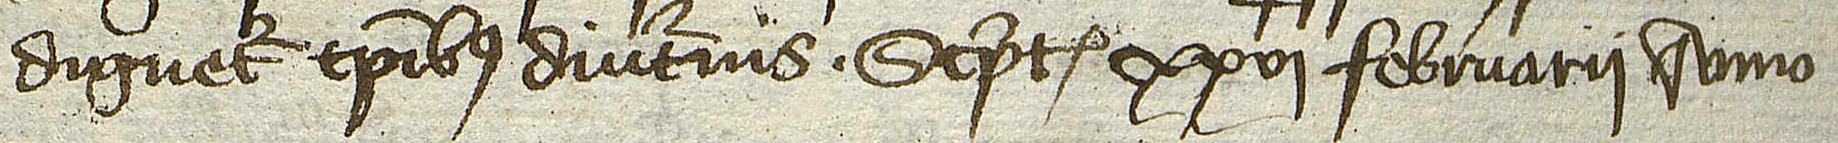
dignet* t*p*ib* diut*nis . Sc*pt* xxvi februarii / Anno
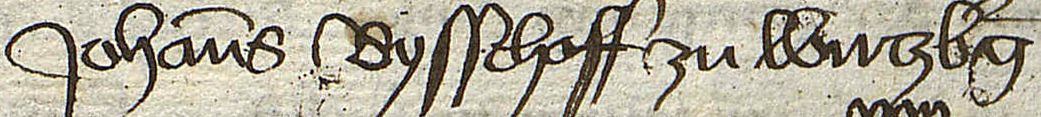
Iohan*s Byſſchoff ʒu Wircʒb*g
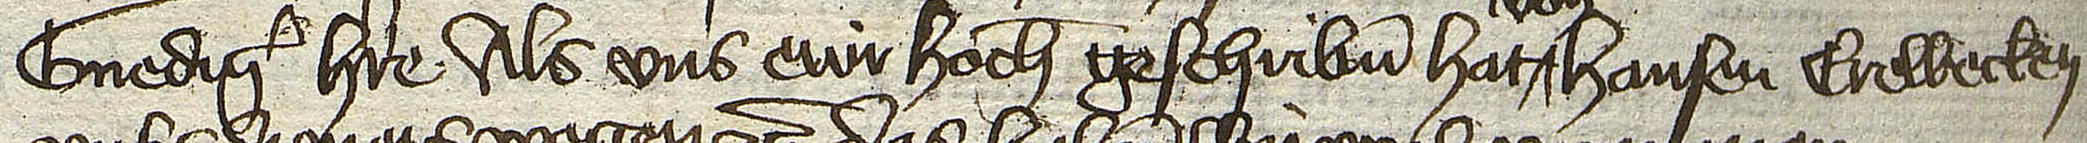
Gnedig* h*re . Als vns ewr hoch* geſchrib*n hat hanſen Erelbecken
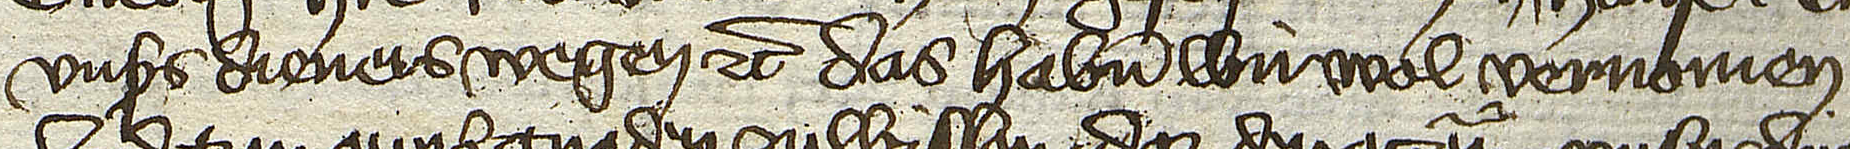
vnſ*s dieners wegen ec* das hab*n wir wol vernomen
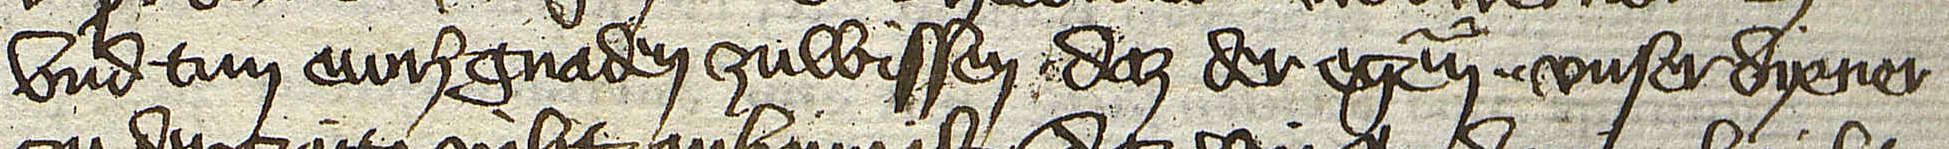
vnd tun ewn* gnaden ʒuwiſſen . daʒ der egen* ~ vnſer dyener
